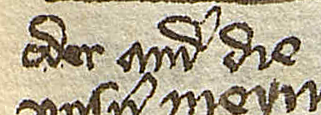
oder and* die
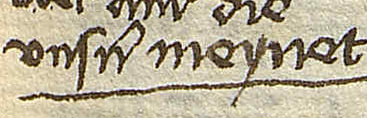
vnſn* meynet
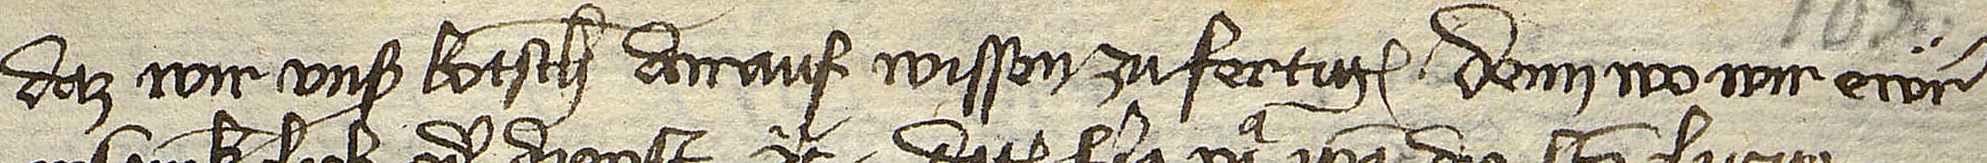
daʒ wir vnſ* botſch* darauf wiſſen ʒu fertig* / Denn wo wir eẅr*
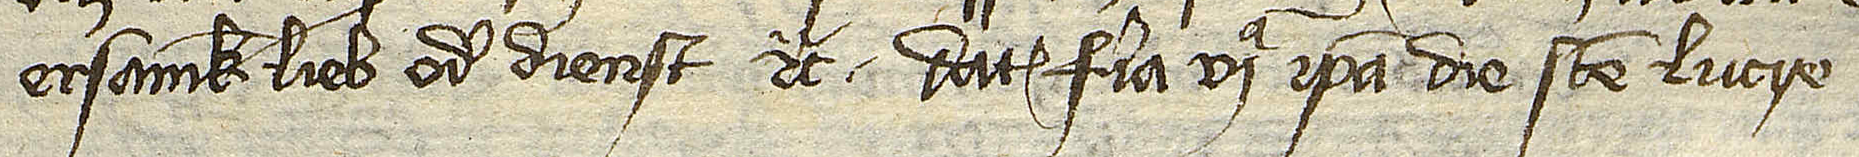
erſamk* lieb od* dienſt ec* / Dat* fi*a vi* ipa* die ſce* Lucye
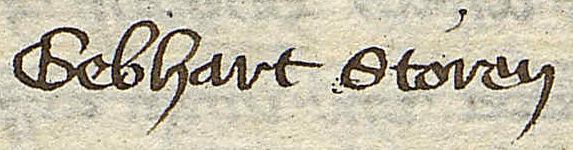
Gebhart Stören
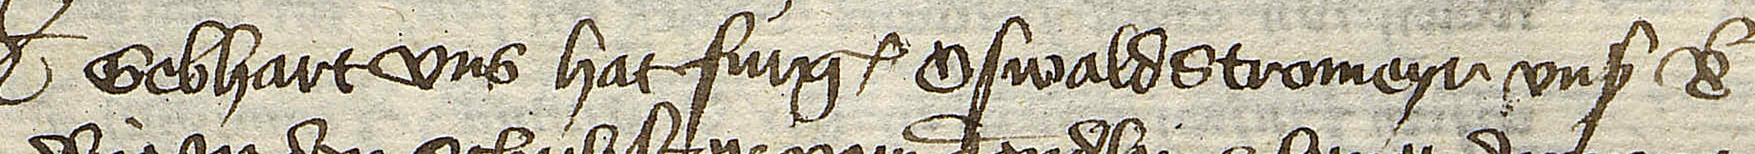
L* Gebhart vns hat fürg* Oſwald Stromeyr vnſ* B*
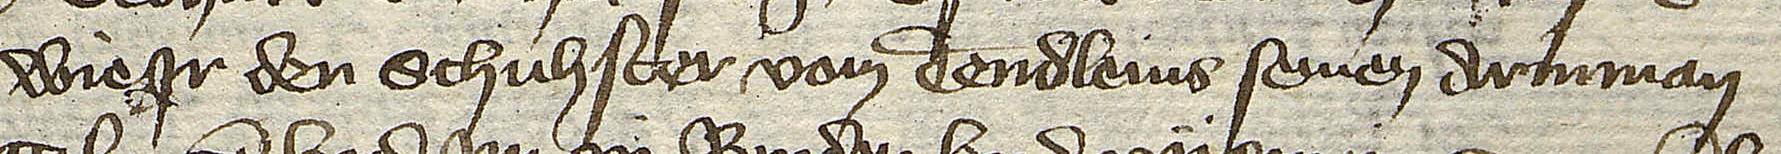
wie Ir den Schuhſter von Tendleins ſeinen Armman
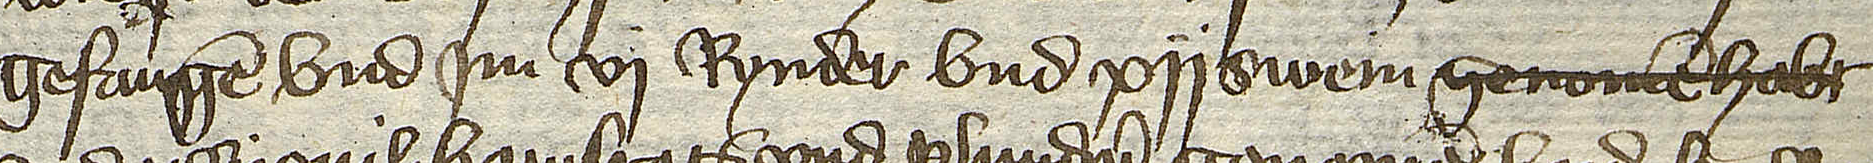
gefange* vnd Im vi Rynder vnd xii Swein genome* habt
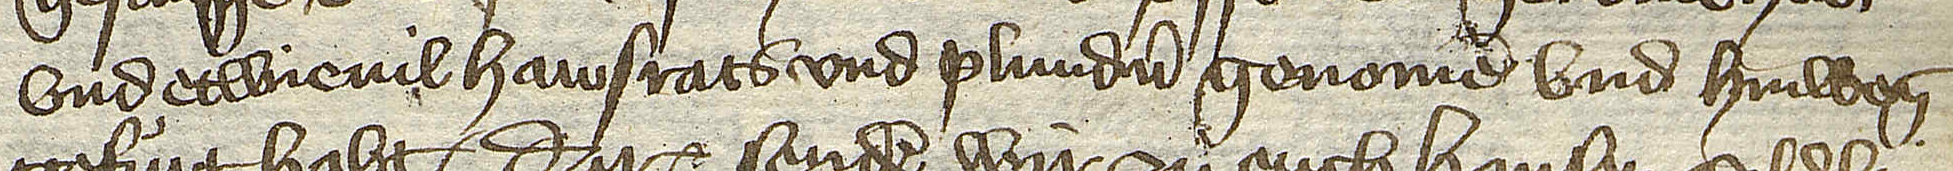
vnd etwieuil hawſrats vnd plundn* genome* vnd hinweg
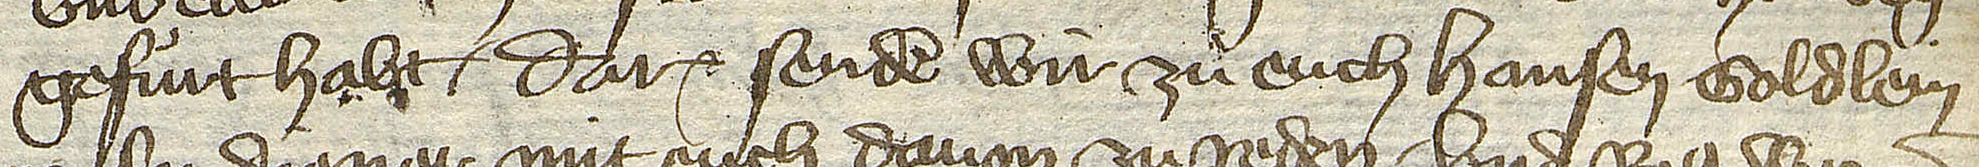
gefürt habt / Dar* ſende* wir cʒu euch hanſen Goldlein
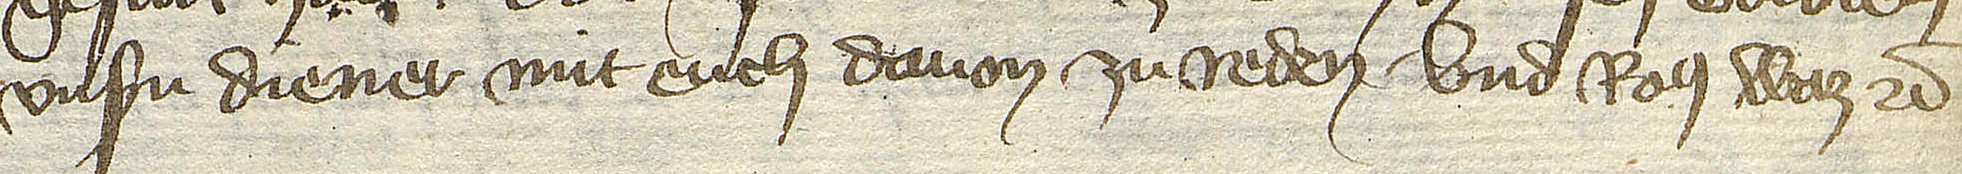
vnſ*n diener mit euch dauon cʒu reden / vnd Ro* waʒ ec*
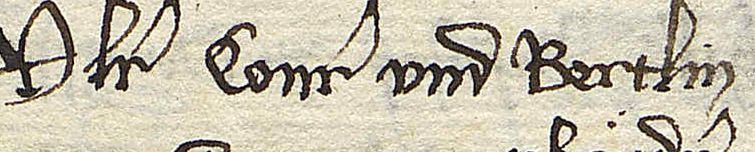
Vlr* Conr* vnd Bertlin
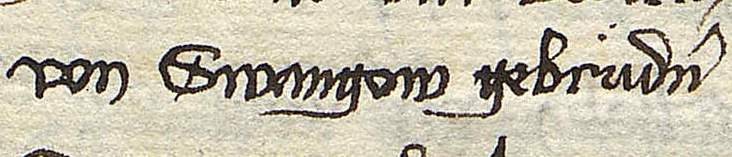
von Swangow gebrüdn*
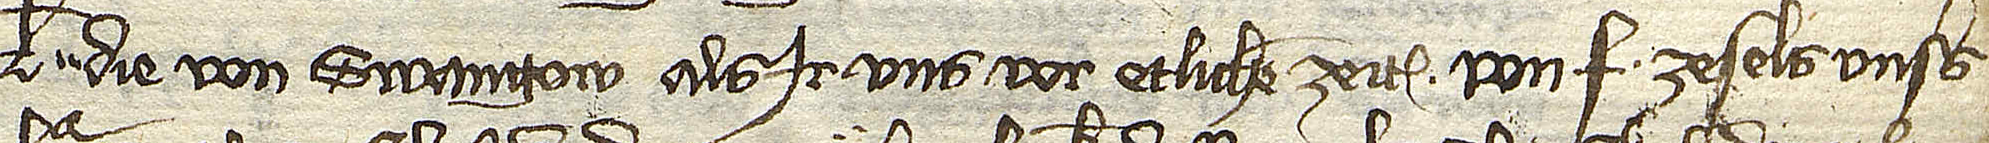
L* ~ die von Swangow als Ir vns vor etliche* ʒeit* . von . F . ʒeſels vnſ*s
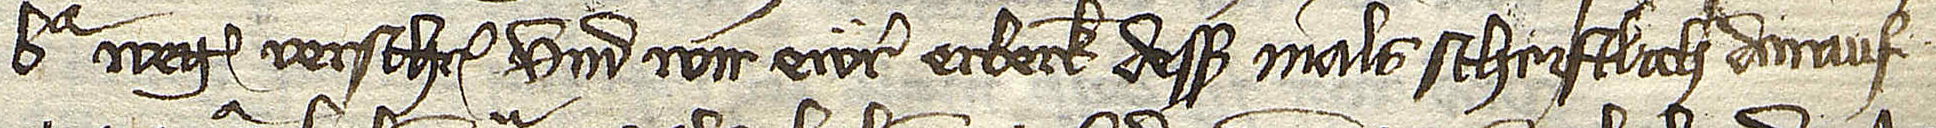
b* weg* verſchr* Vnd wir eẅr* erberk* deſſ* mals ſchriftlich darauf
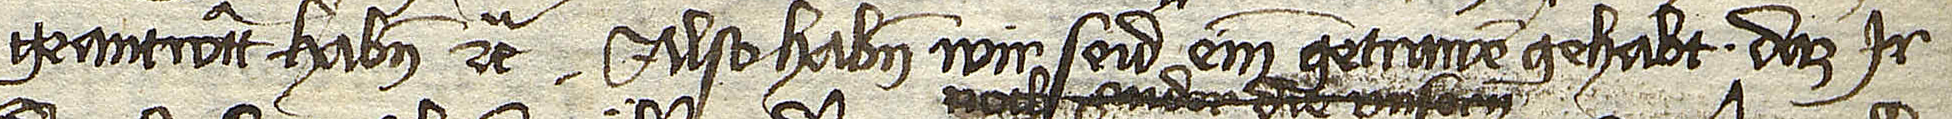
geantw*tt habn* ec* / Alſo habn* wir ſeid ein* getrawe* gehabt . daʒ Ir
